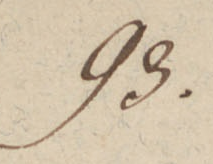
93.
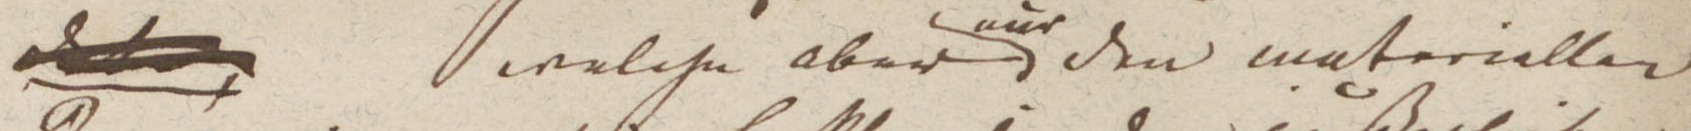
dete, welche aber nur den materiellen
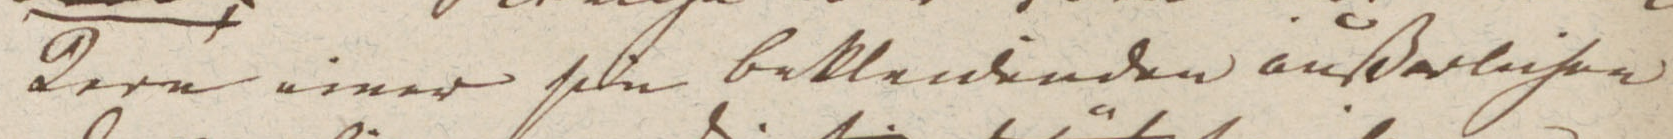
Kern einer sie bekleidenden äusserlichen
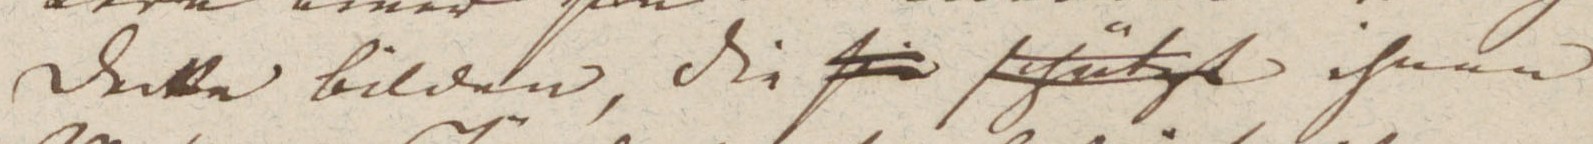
Decke bilden, die sie schützt ihnen
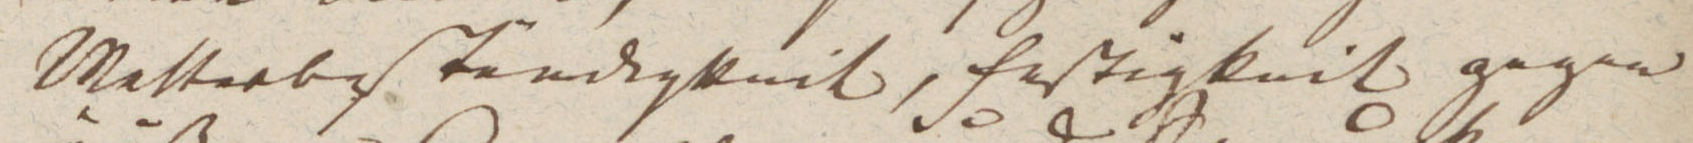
Wetterbeständigkeit, Festigkeit gegen
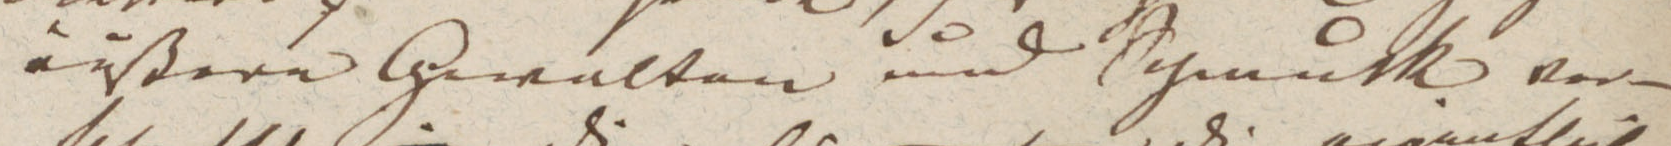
äussere Gewalten und Schmuck ver-
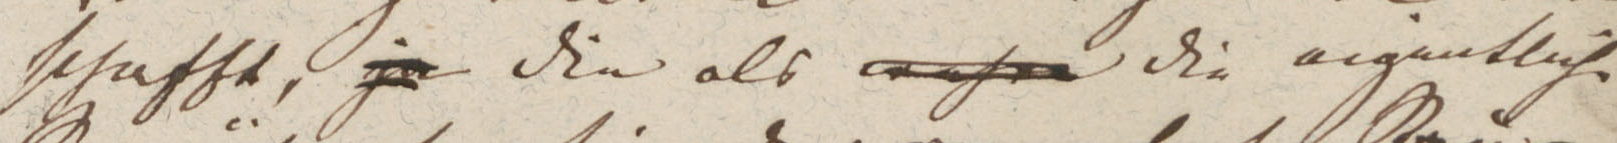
schafft j die als wahre die eingentliche
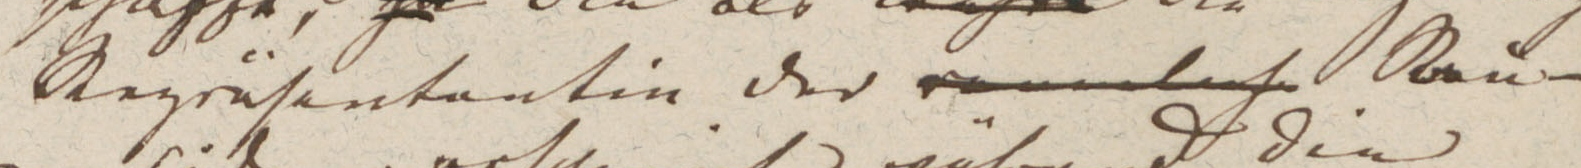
Repräsentantin der raumliche Rau-
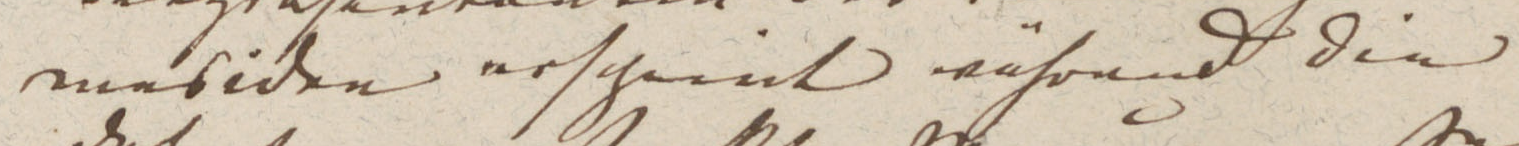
mesidee erscheint während die
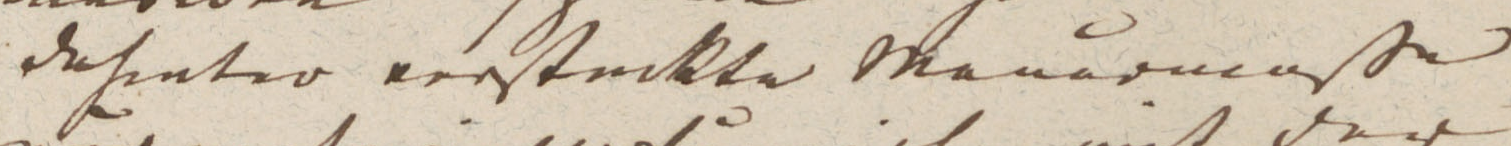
dahinter versteckte Mauermasse
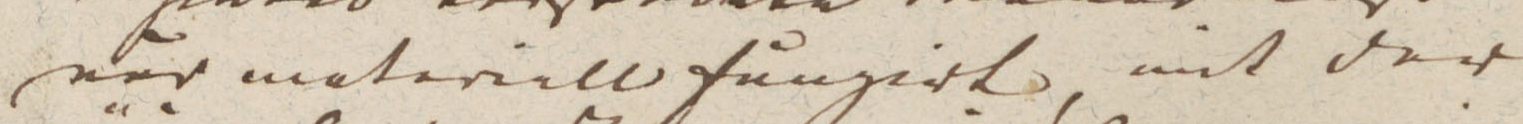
nur materiell fungirt, mit der
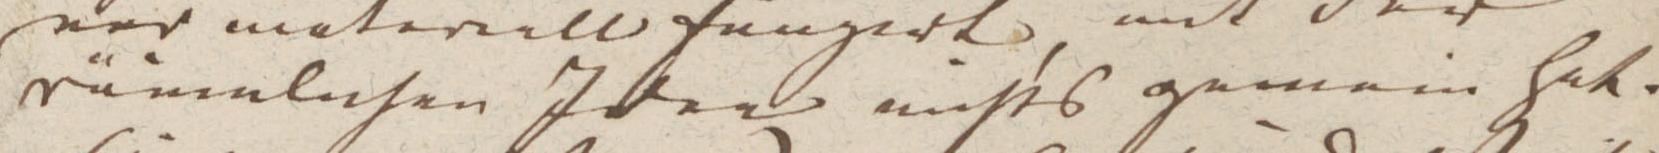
räumlichen Idee nichts gemein hat.
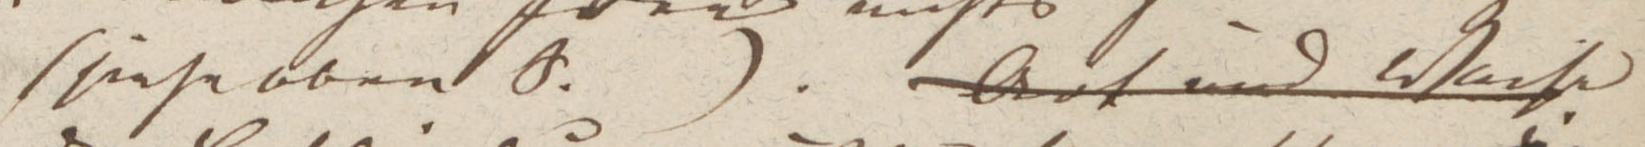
(siehe oben S. ). Art und Weise
